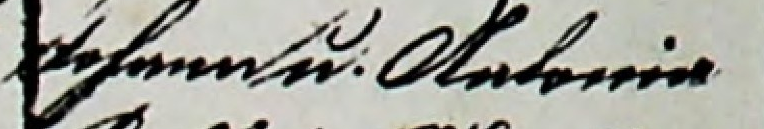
Johann u. Antonia
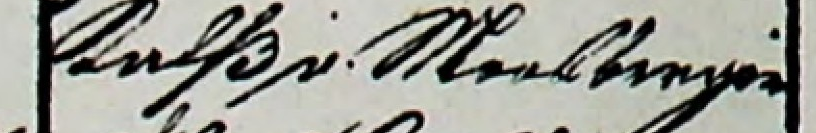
Kalß v. Morsberger
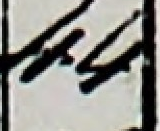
44
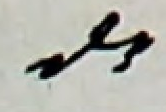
do
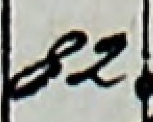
82
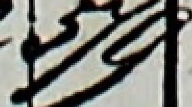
579
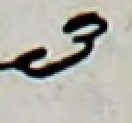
3
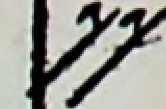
77
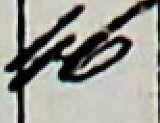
46
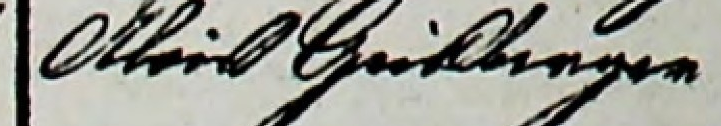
Alois Geisberger
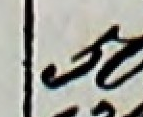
50
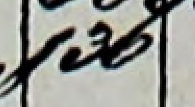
136
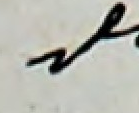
do
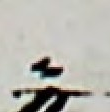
„
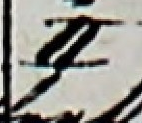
II
